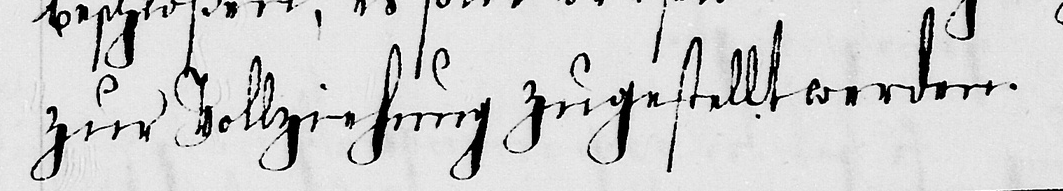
zur Vollziehung zugestellt werden.
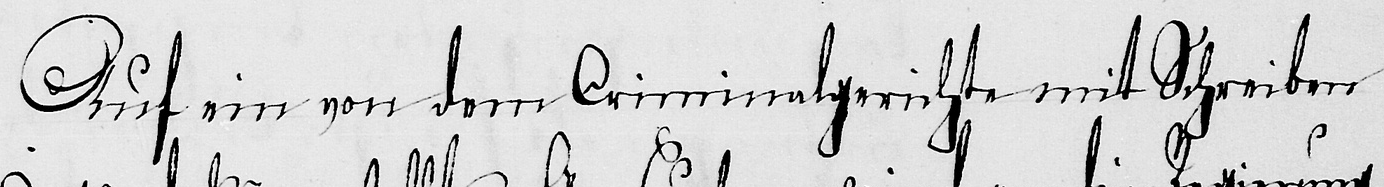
Auf ein von dem Criminalgerichte mit Schreiben
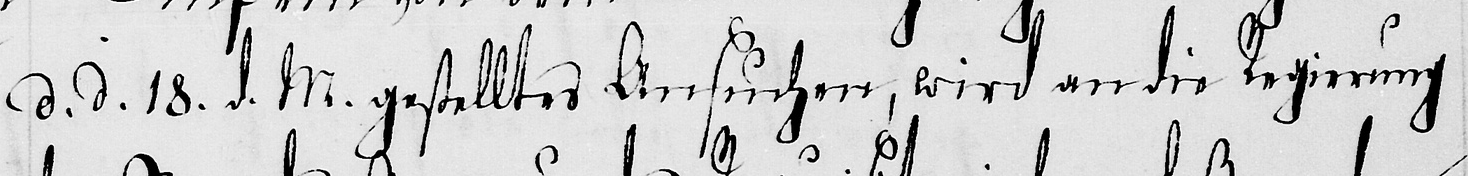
d.d. 18. d. M. gestelltes Ansuchen, wird an die Regierung
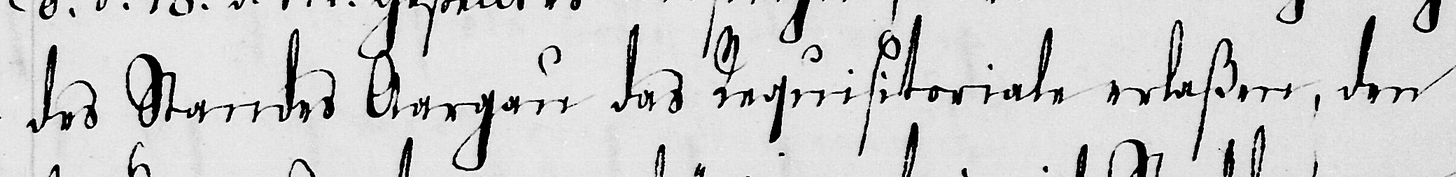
des Standes Aargau das Requisitoriale erlaßen, den
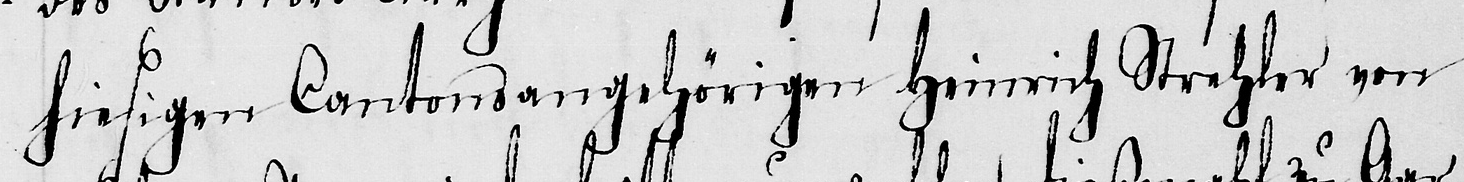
hiesigen Cantonsangehörigen Heinrich Strehler von
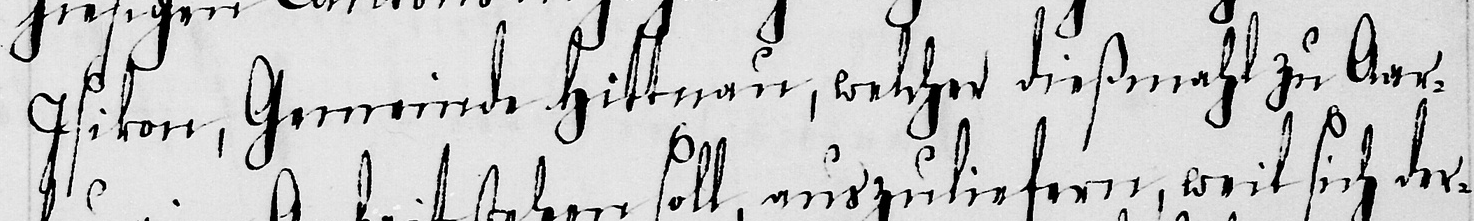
Isikon, Gemeinde Hittnau, welcher dießmahl zu Aar¬
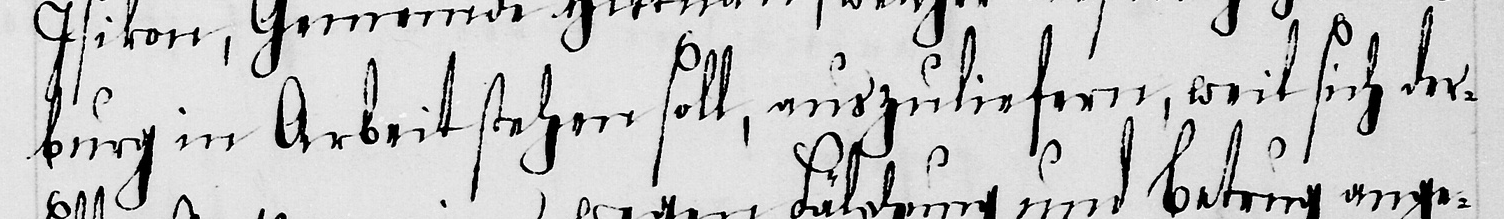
burg in Arbeit stehen soll, auszuliefern, weil sich der¬
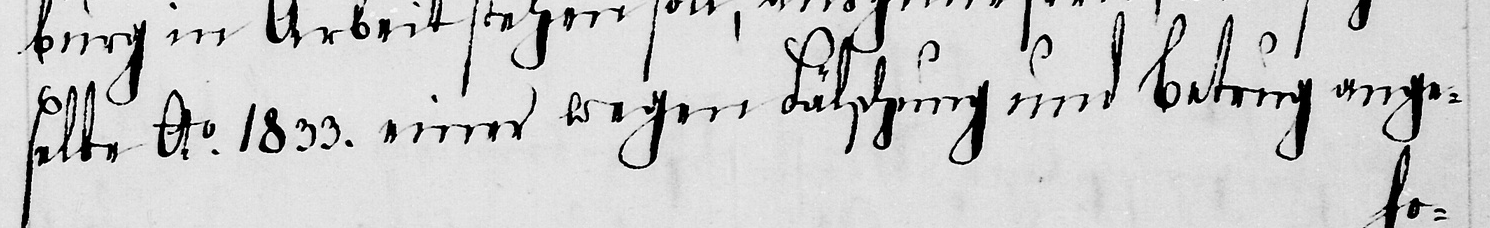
selbe Ao. 1833. einer wegen Fälschung und Betrug ange-
